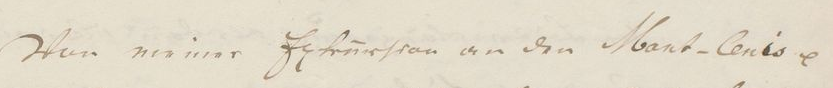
Von meiner Exkursion an den Mont-Cenis &
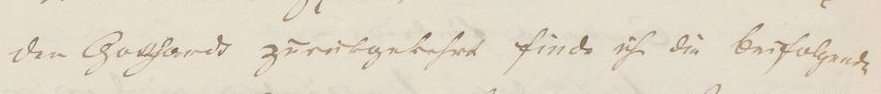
den Gotthardt zurükgekehrt finde ich die beifolgende
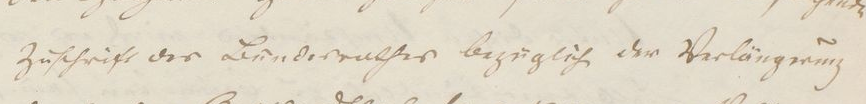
Zuschrift des Bundesrathes bezüglich der Verlängerung
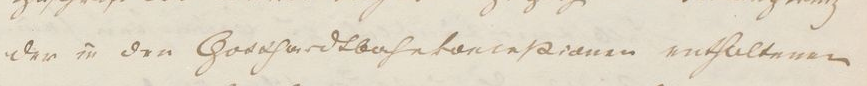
der in den Gotthardtbahnkonzeßionen enthaltenen
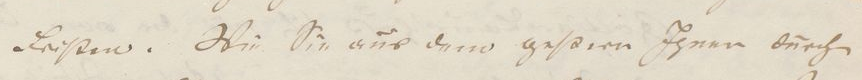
Fristen. Wie Sie aus dem gestern Ihnen durch
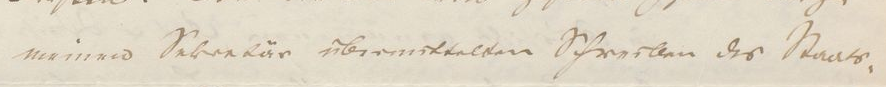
meinen Sekretär übermittelten Schreiben des Staats-
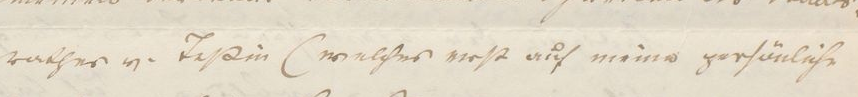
rathes v. Teßin (welches erst auf meine persönliche
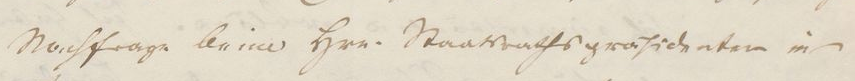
Nachfrage beim Hrn. Staatsrathspräsidenten in
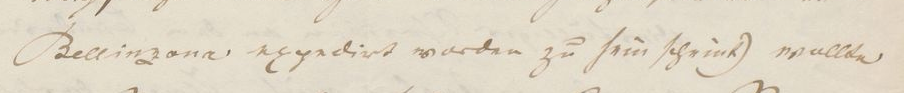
Bellinzona expedirt worden zu sein scheint) wollte
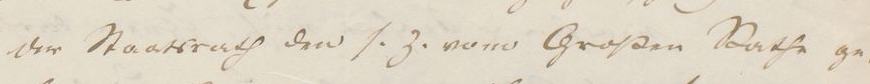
der Staatsrath den s. Z. vom Großen Rathe ge-
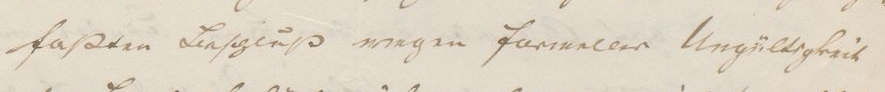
faßten Beschluß wegen formeller Ungültigkeit
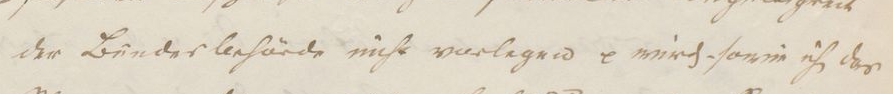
der Bundesbehörde nicht vorlegen & wird – sowie ich das
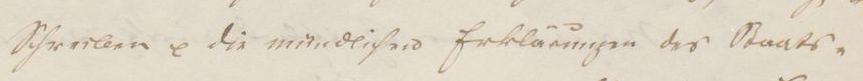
Schreiben & die mündlichen Erklärungen des Staats-
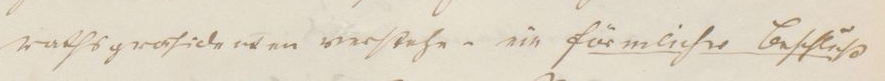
rathspräsidenten verstehe – ein förmlicher Beschluß
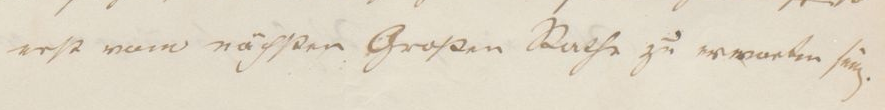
erst vom nächsten Großen Rath zu erwarten sein.
